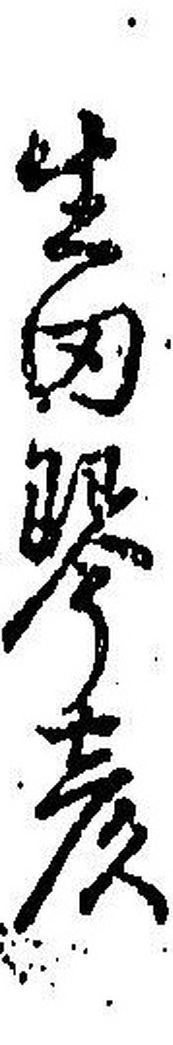生田琴彦
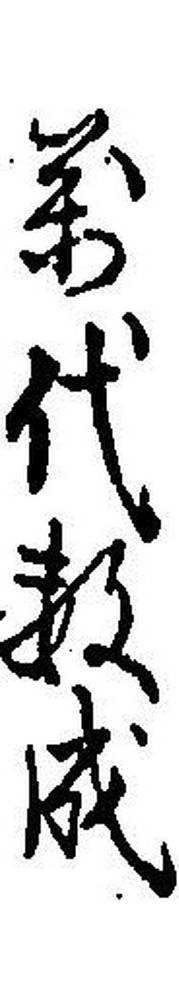万代数成
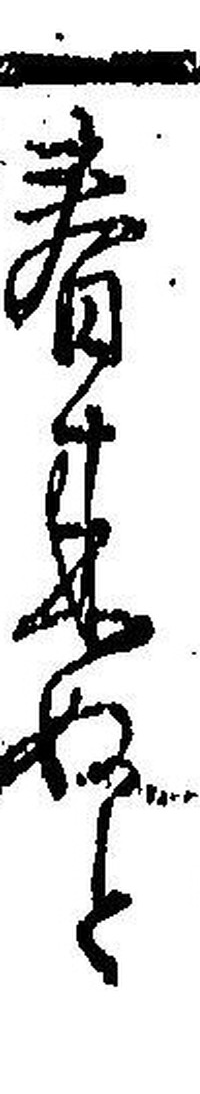春来ぬと
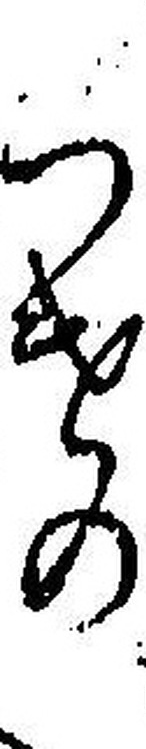つけの
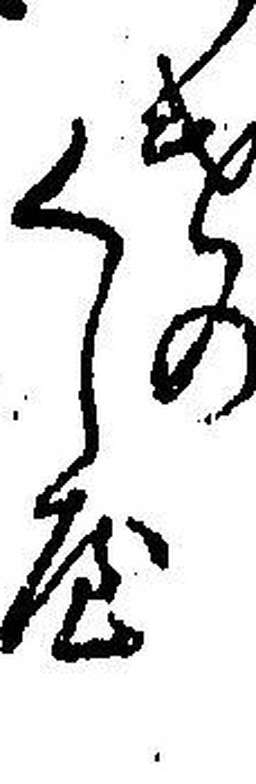くし屋
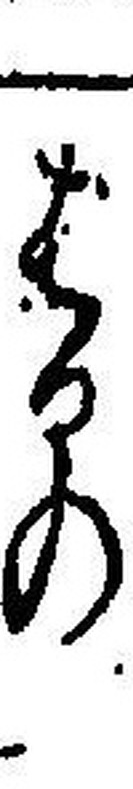はるの
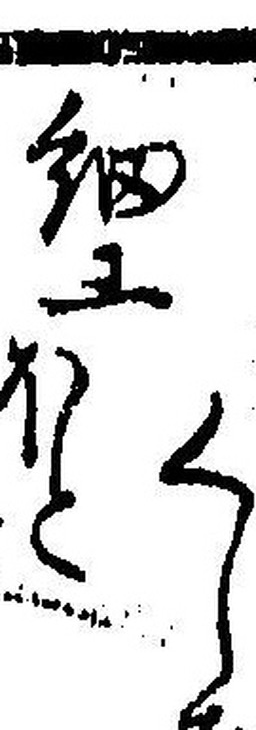細工ほと
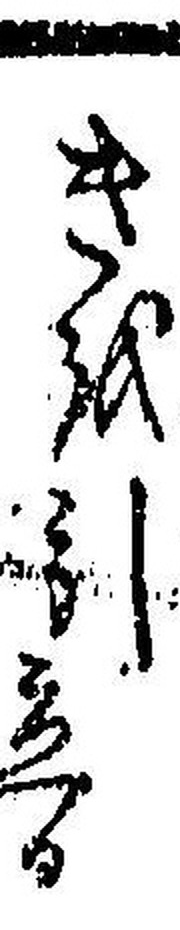きを引立る
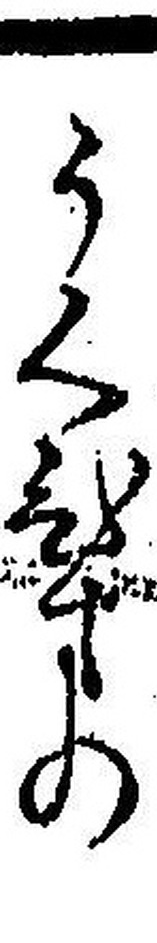うくひすの
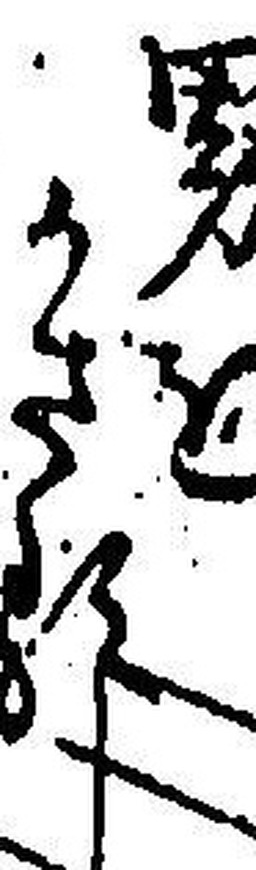かさる
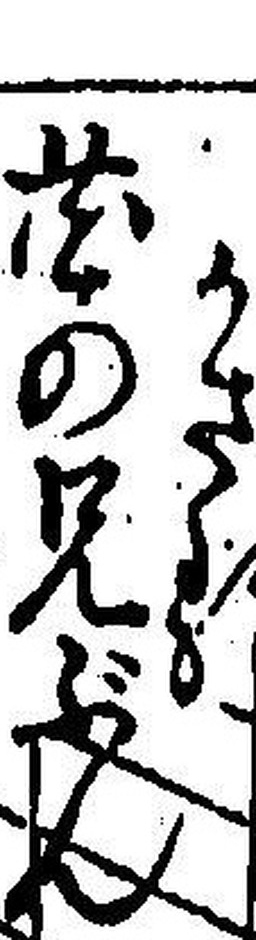花の兄ぶん
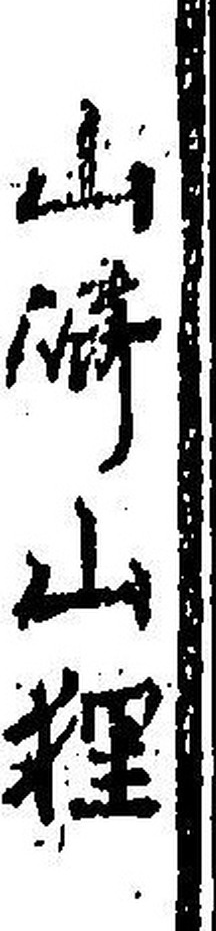山崎山狸
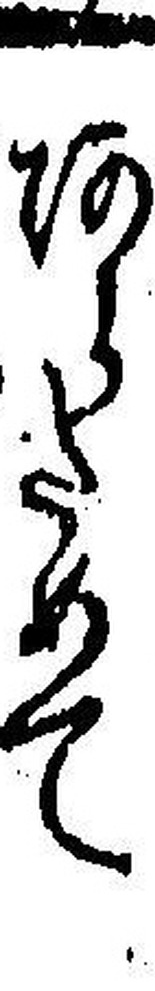あらためて
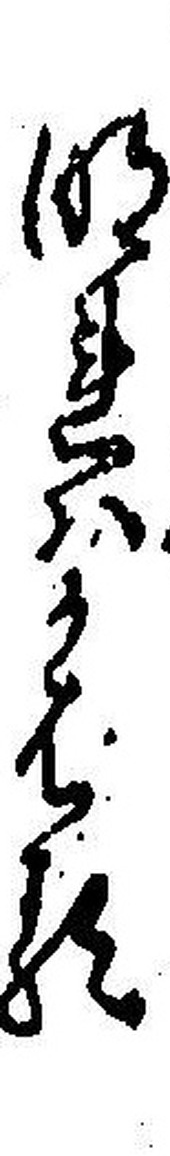明れはかはる
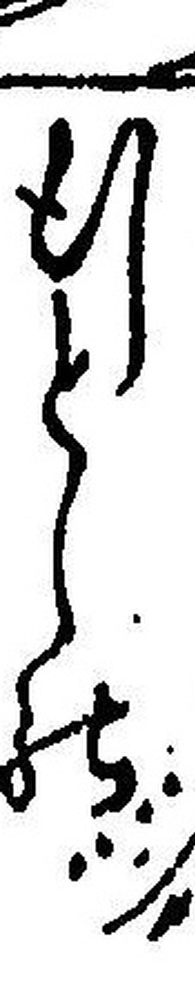行としの
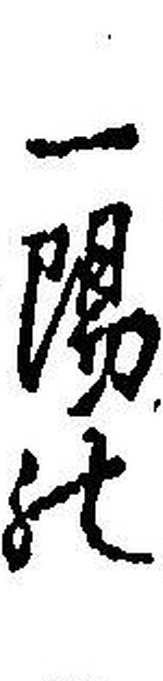一陽の
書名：どうれ百人一首 / 鹿都部真顔(狂歌堂)編
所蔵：東京大学総合図書館 General Library in the University of Tokyo, JAPAN
